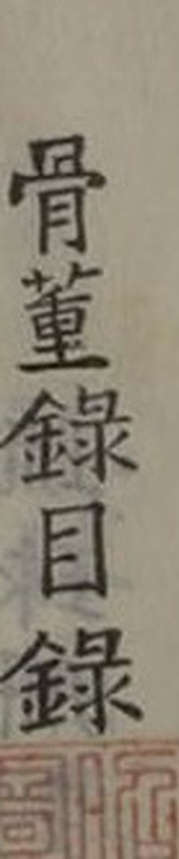骨董録目録
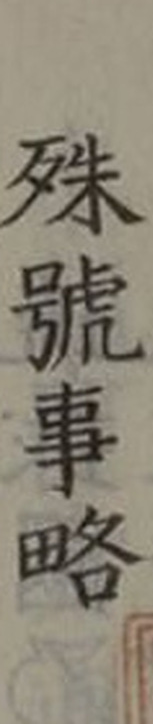殊號事略
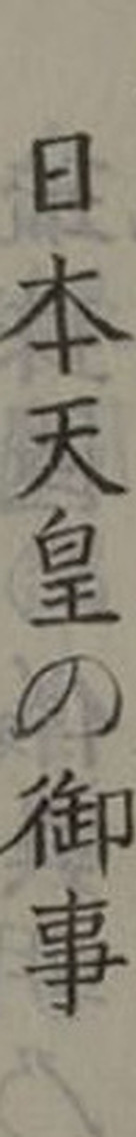日本天皇の御事
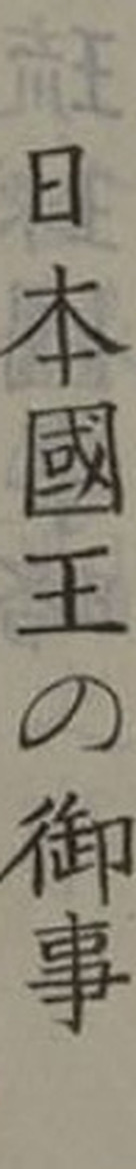日本國王の御事
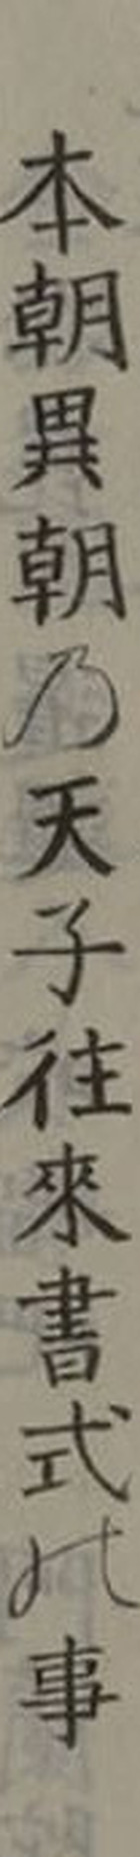本朝異朝の天子往來書式の事
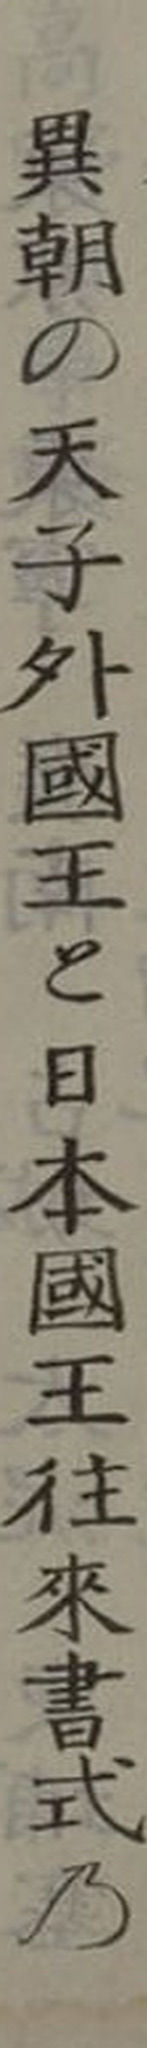異朝の天子外國王と日本國王往來書式の
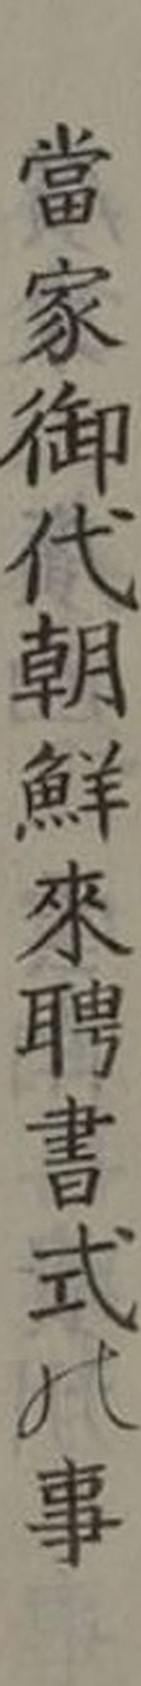當家御代朝鮮來聘書式の事
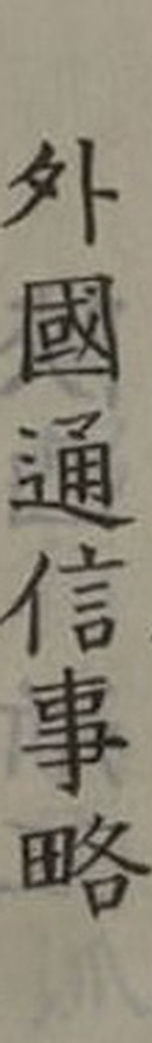外國通信事略
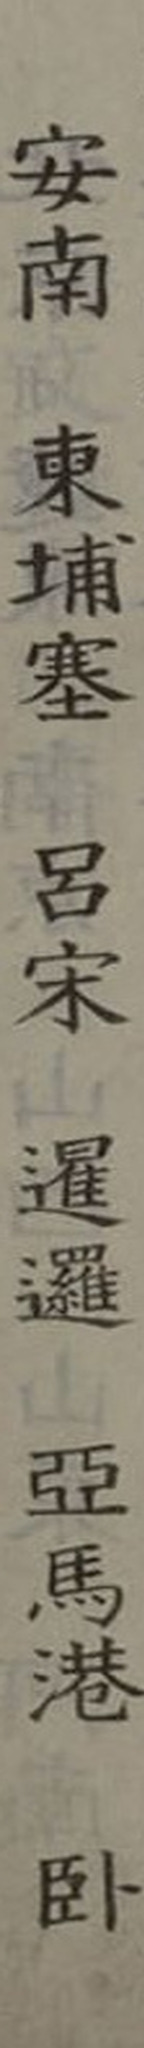安南柬埔塞呂宋暹邏亞馬港卧
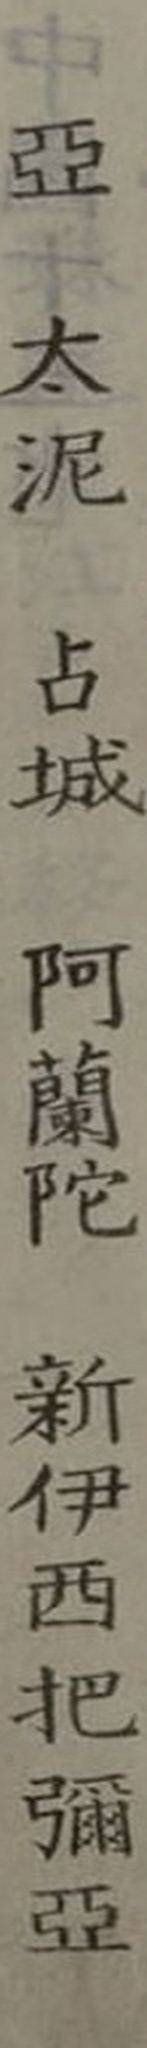亞太泥占城阿蘭陀新伊西把彌亞
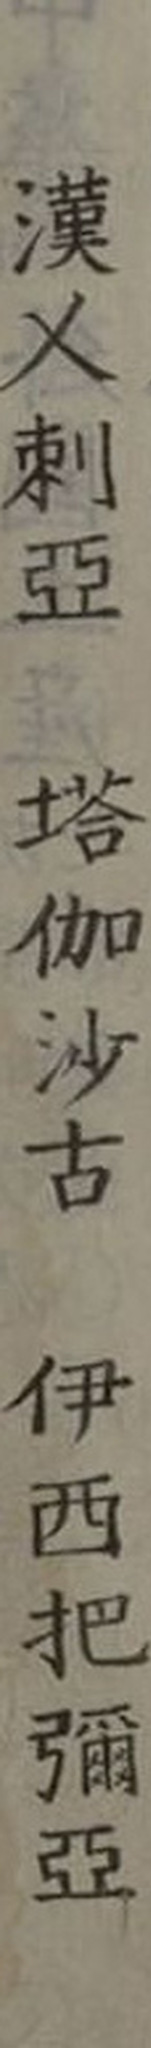漢乂刺亞塔伽沙古伊西把彌亞

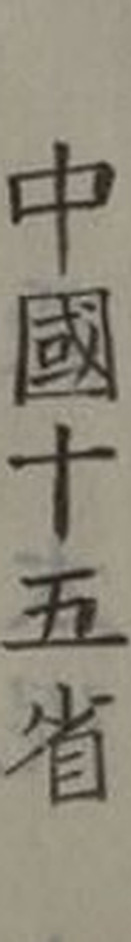中國十五省
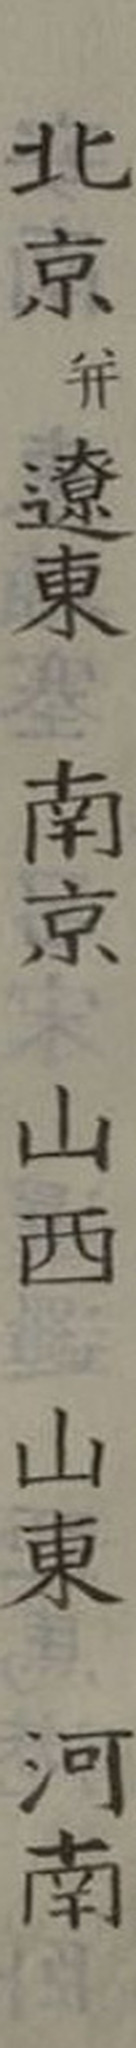北京并遼東南京山西山東河南
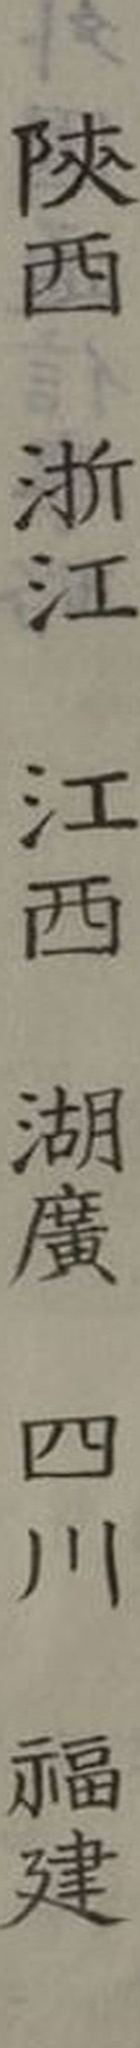陝西浙江江西湖廣四川福建
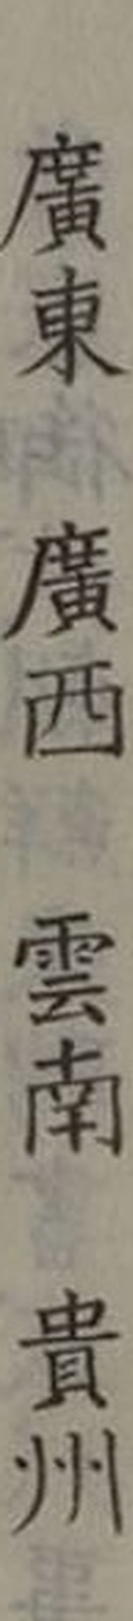廣東廣西雲南貴州
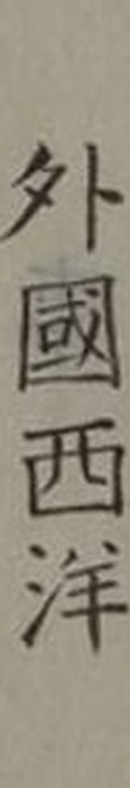外國西洋
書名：骨董録
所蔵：University of the Ryukyus Library
